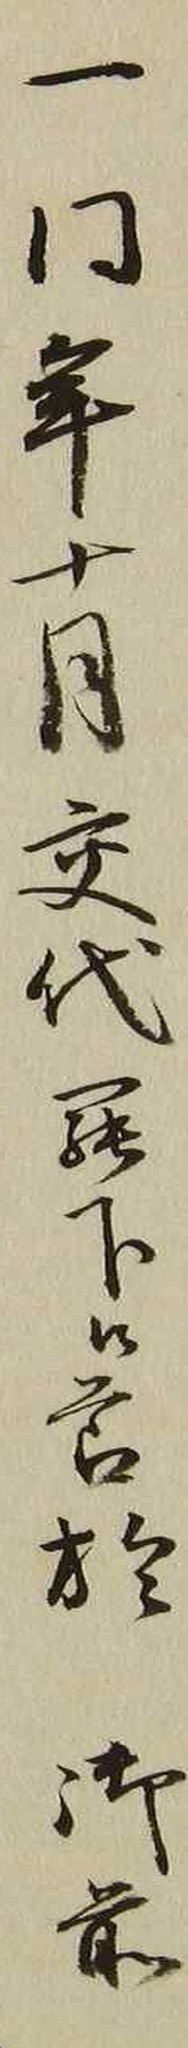一同年十一月交代罷下候節於御前
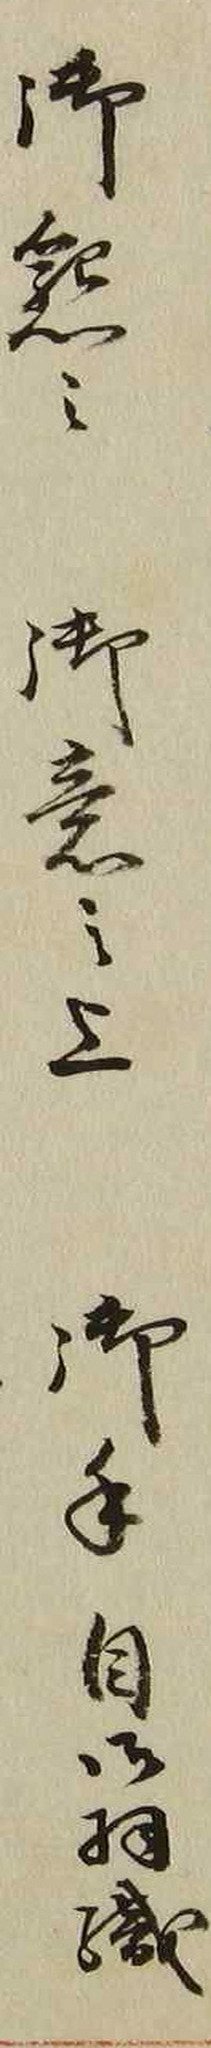御懇之御意之上御手自御羽織
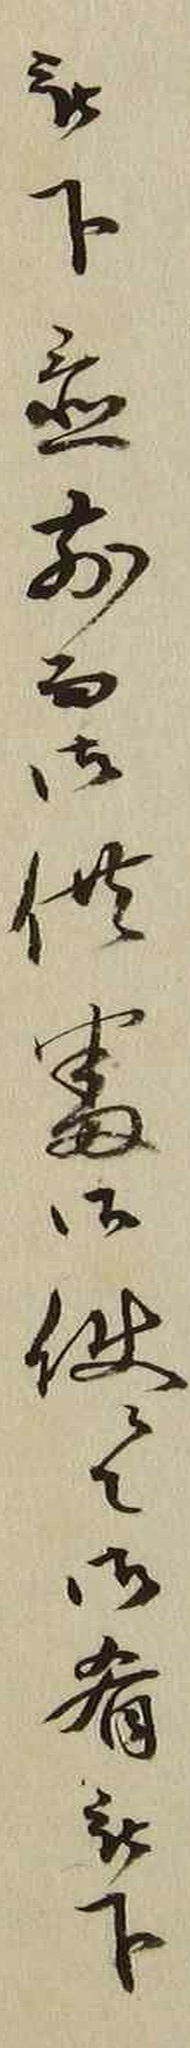被下置別而御供番御使にて御肴被下
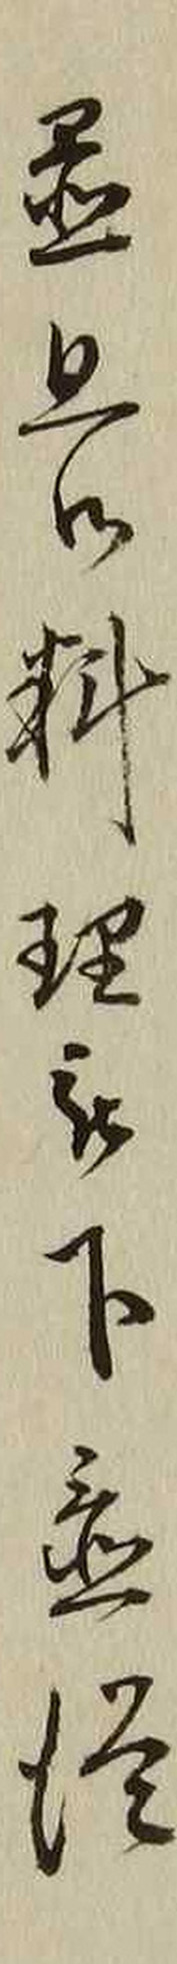置且御料理被下置従
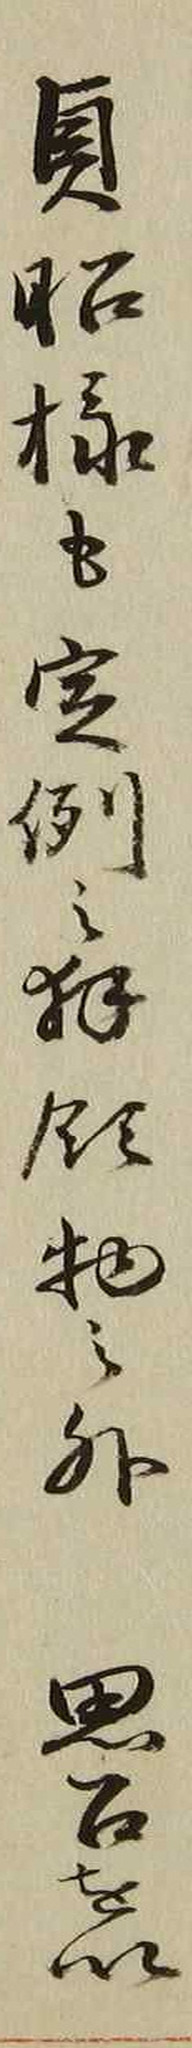貞昭様も定例拝領物之外思召を以
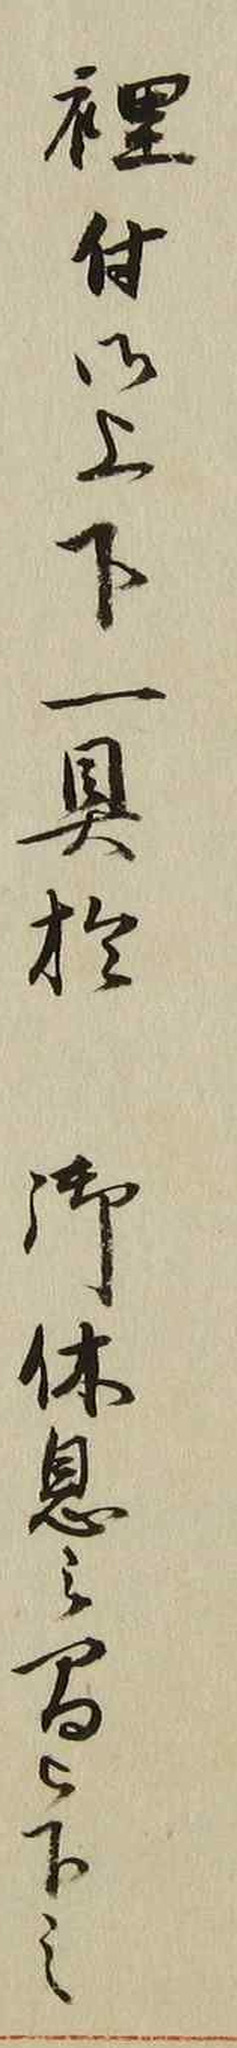裏付御上下一具於御休息之間被下之
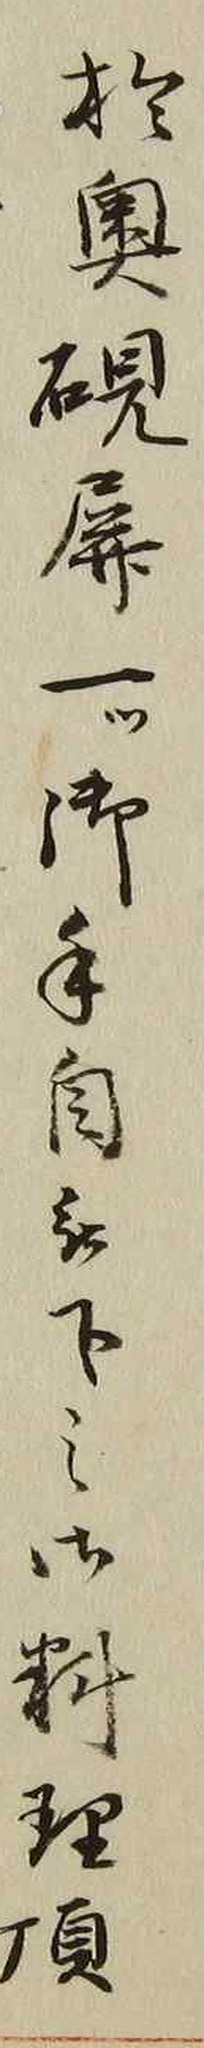於奥硯屏一つ御手自被下之御料理頂
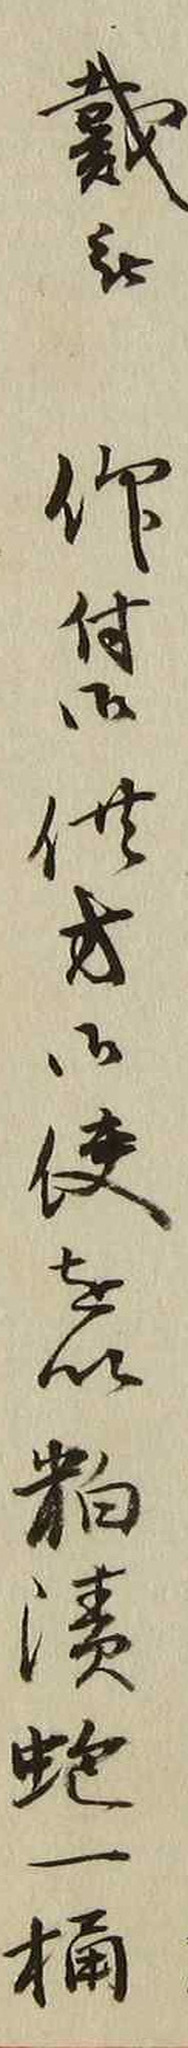戴被仰付御供方御使を以粕漬蚫一桶
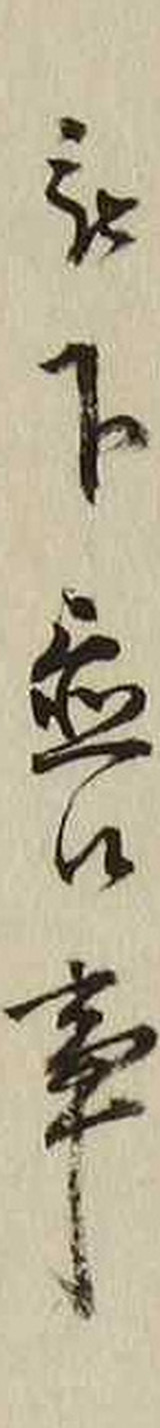被下置候事
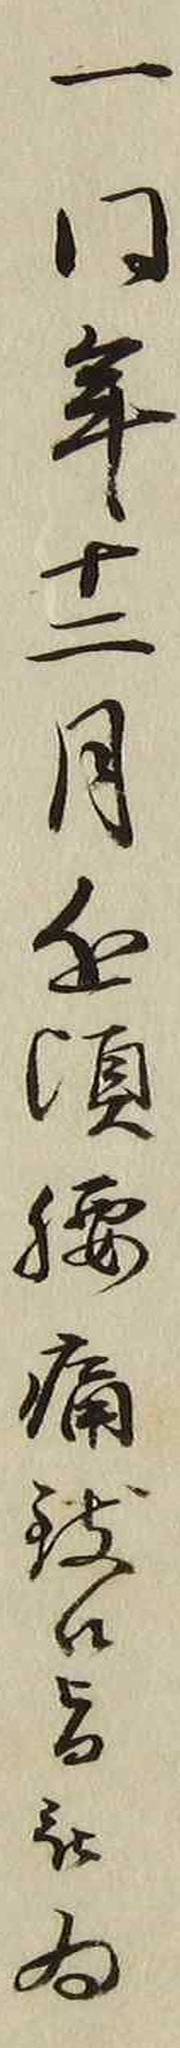一同年十二月近頃腰痛致候旨被為
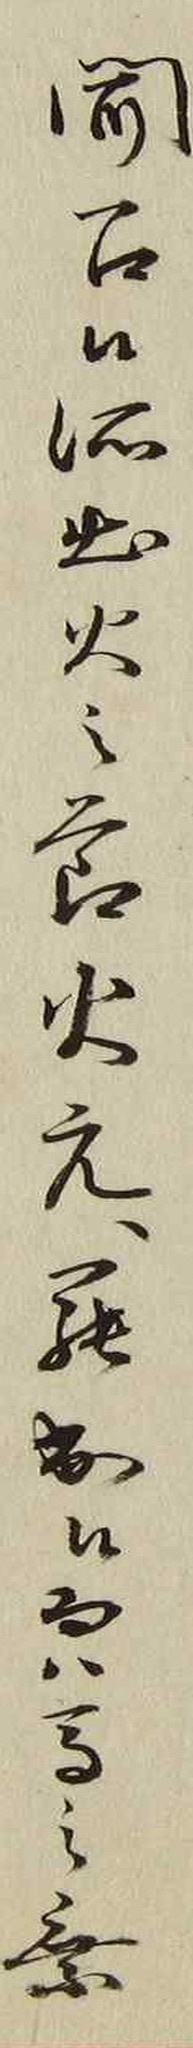聞召候所出火之節罷出候而は馬之乗
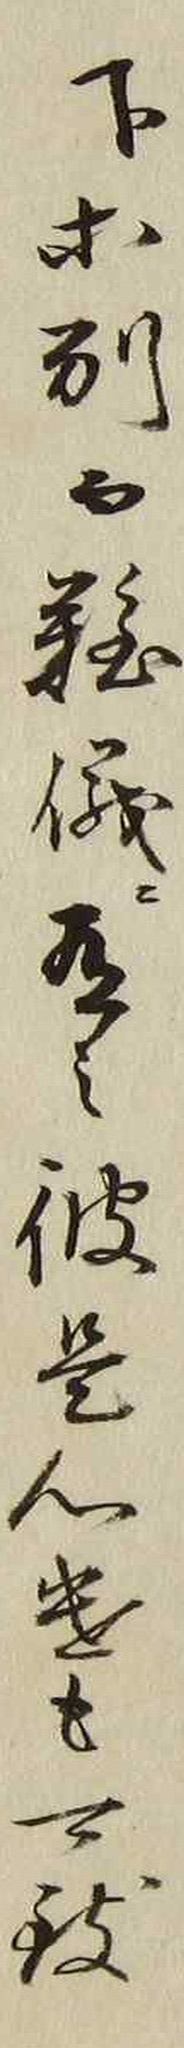下等別而難儀に有之彼是心遣も可致
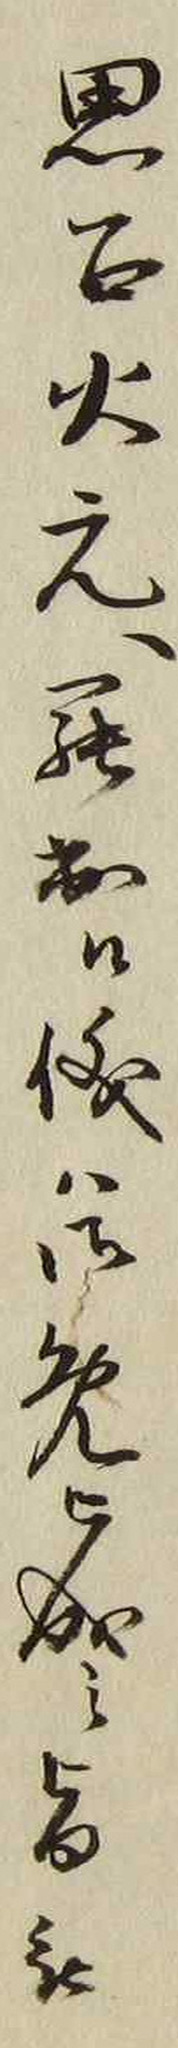思召火元へ罷出候儀は御免被成候旨被
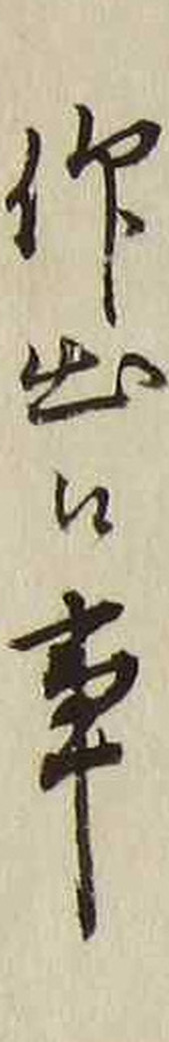仰出候事
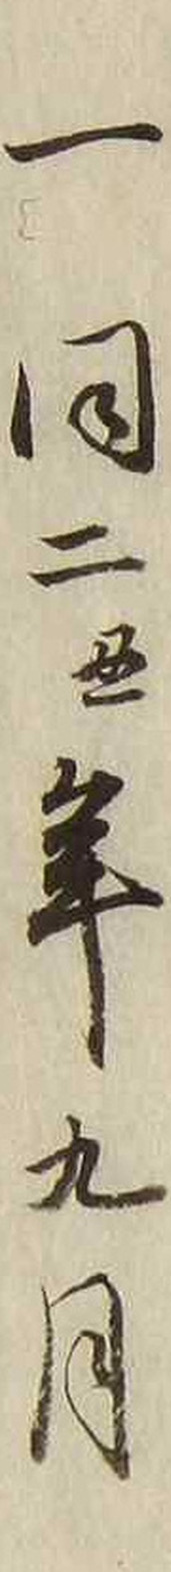一同二丑年九月

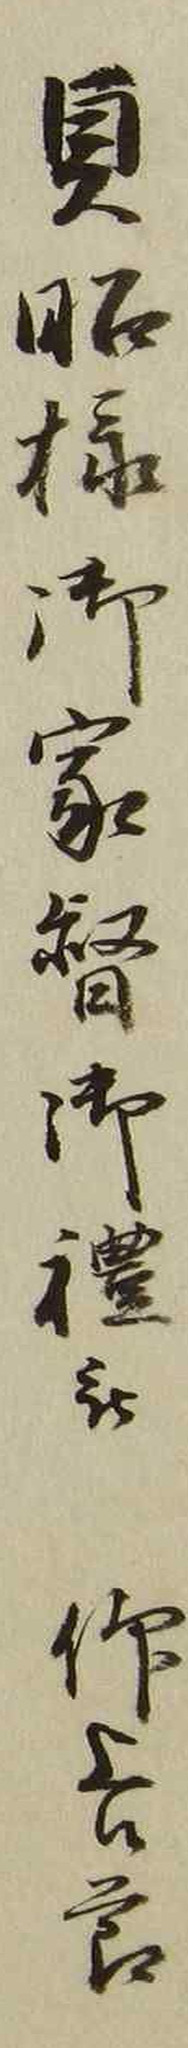貞昭様御家督御礼被仰上候節
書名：諸士系譜　巻之125　た之部1
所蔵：会津若松市立会津図書館
